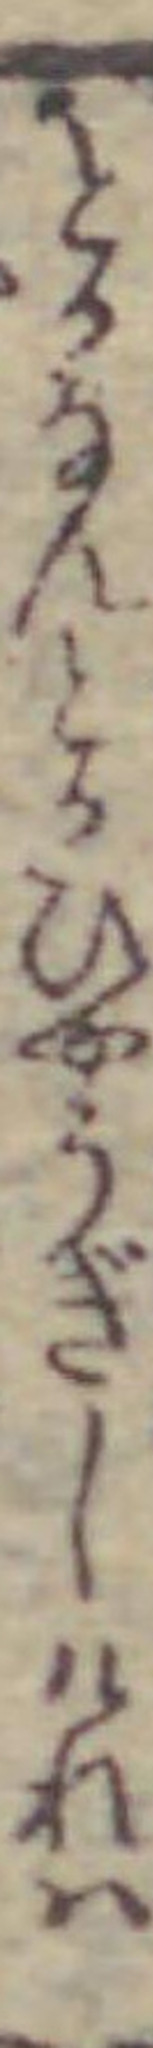とかなんとかひやうぎしけれは
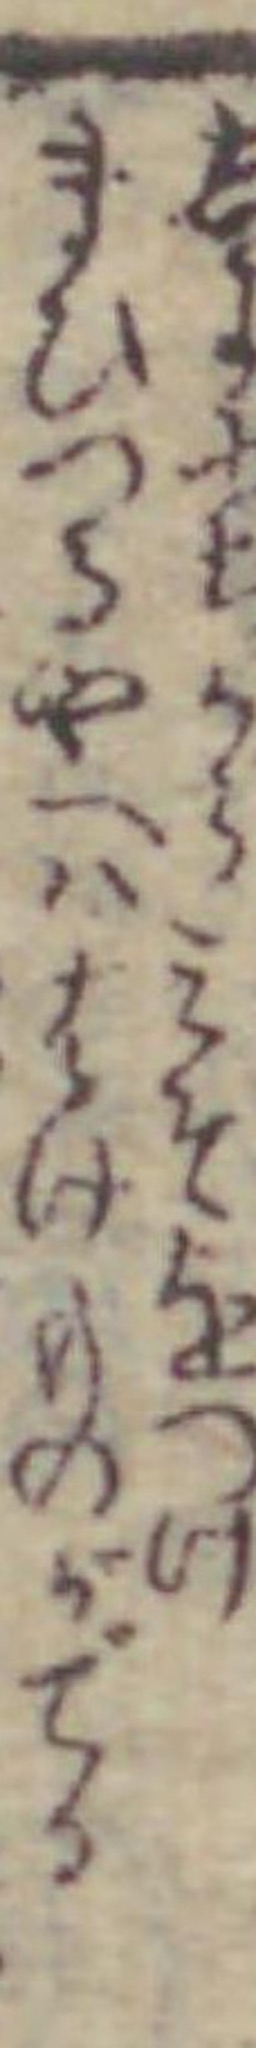まひつるやへははけものがでる
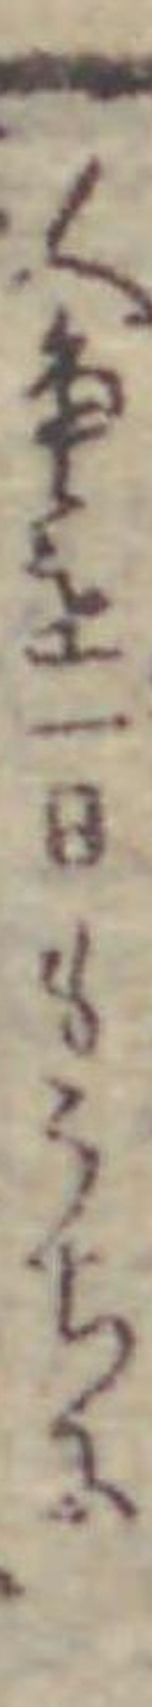人魚を一日もうちに
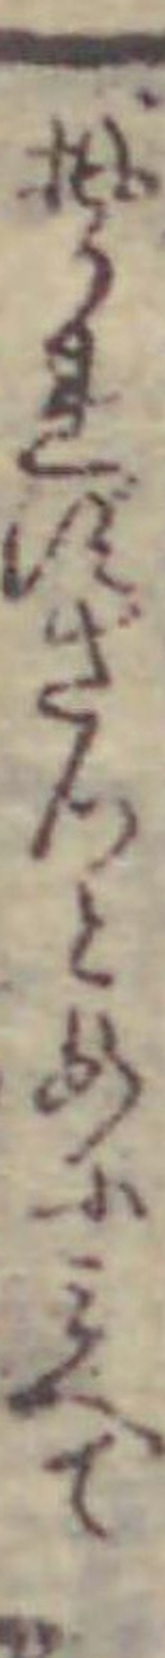おかれずざつとめにみへて
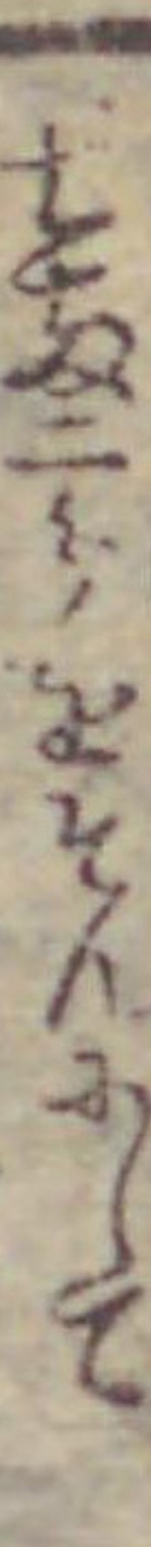七両二分をそんにして
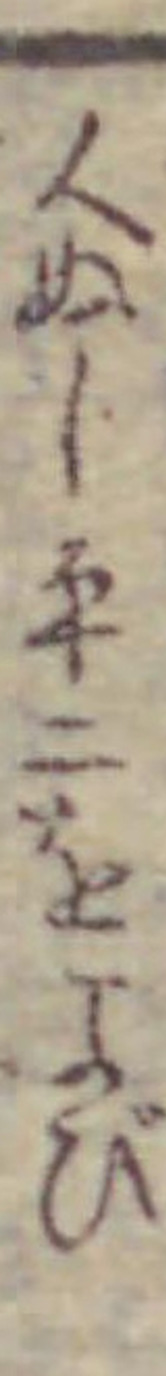人ぬし平次をよび
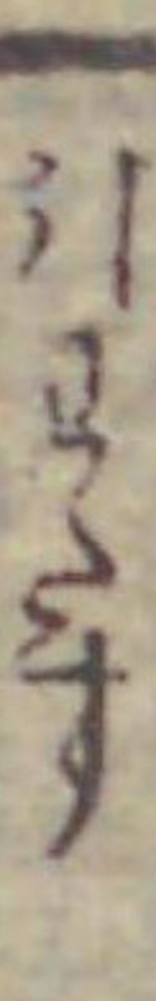引わたす
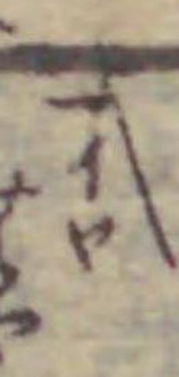〽イヤ
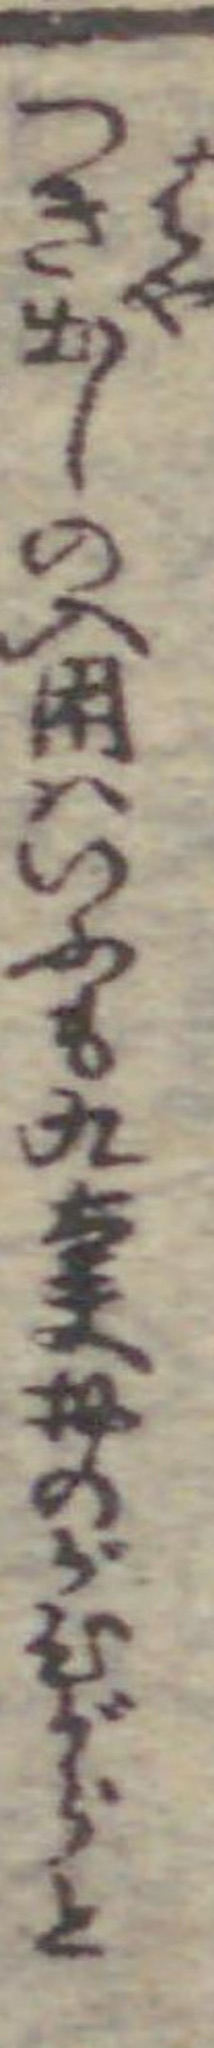つき出しの入用はいふも九太夫おのがひがらと
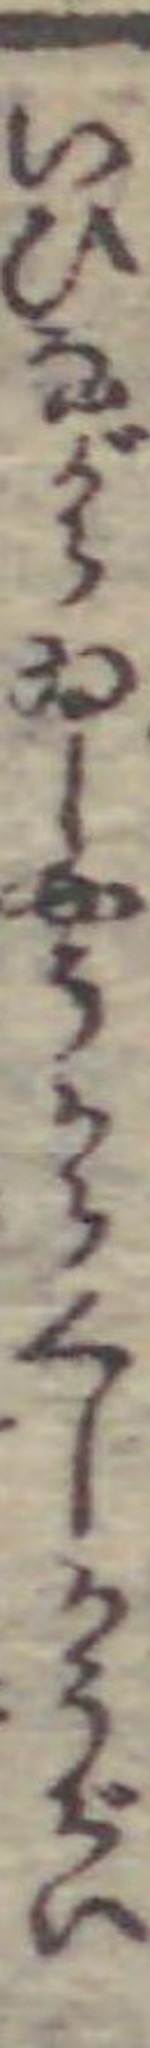いひながらゐしやうからくじかうがい
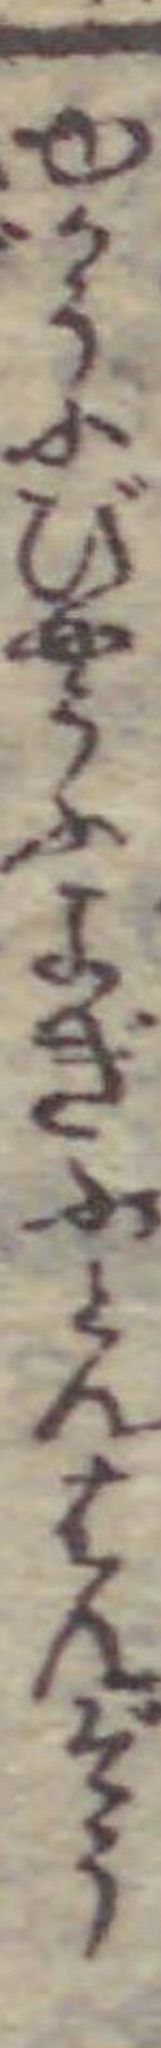ゆかうにびやうふよぎふとんはんぞう
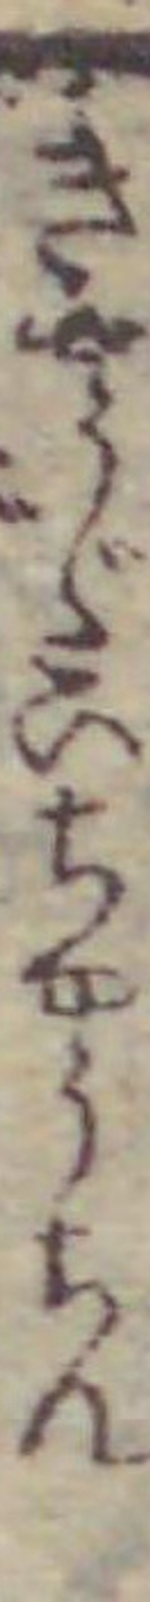きやうだいちやうちん
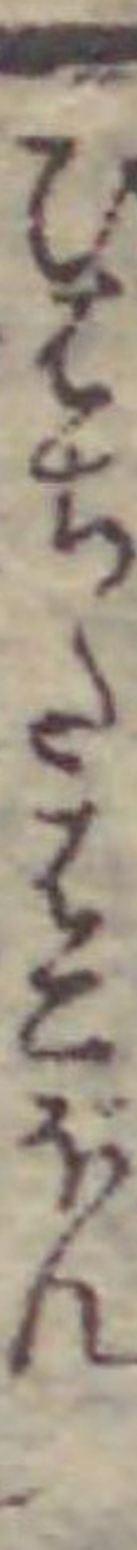ひばちたはこぼん
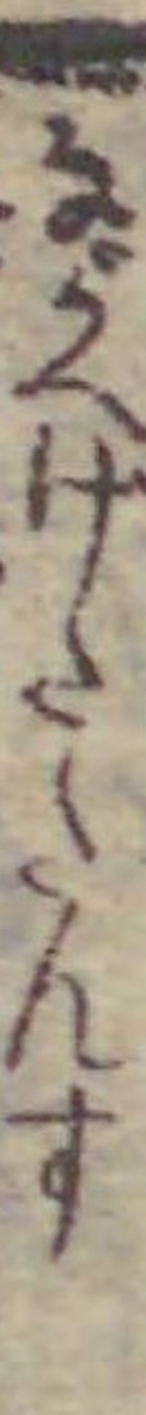ながへげたたんす
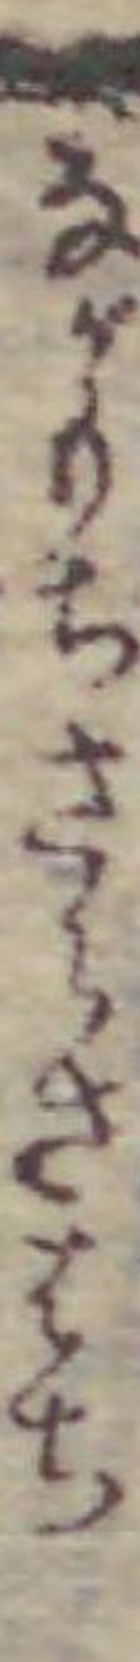ながもちさらさはち
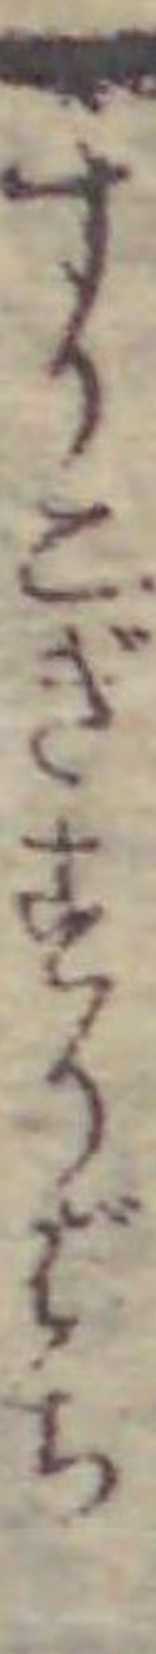すりこぎすりばち
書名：箱入娘面屋人魚 3巻
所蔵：国立国会図書館 National Diet Library, JAPAN
